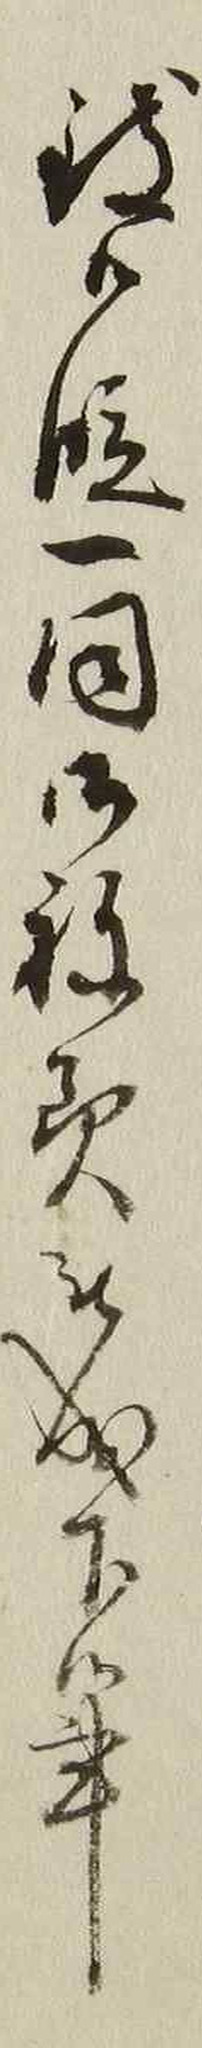致候段一同御称美被成下候事
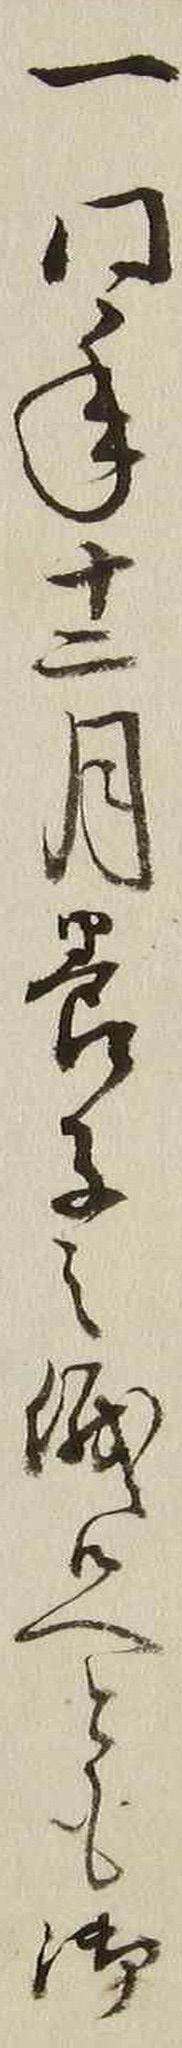一同年十二月養子之儀候へとも御
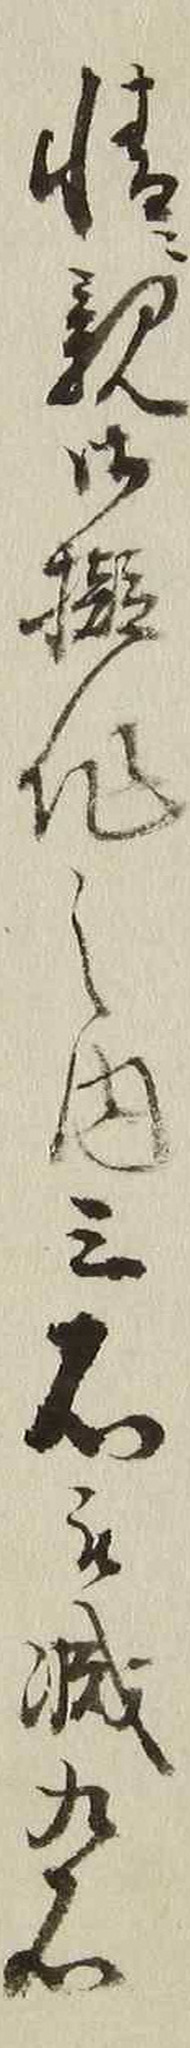情ニ親御擬作之内三石被減九石
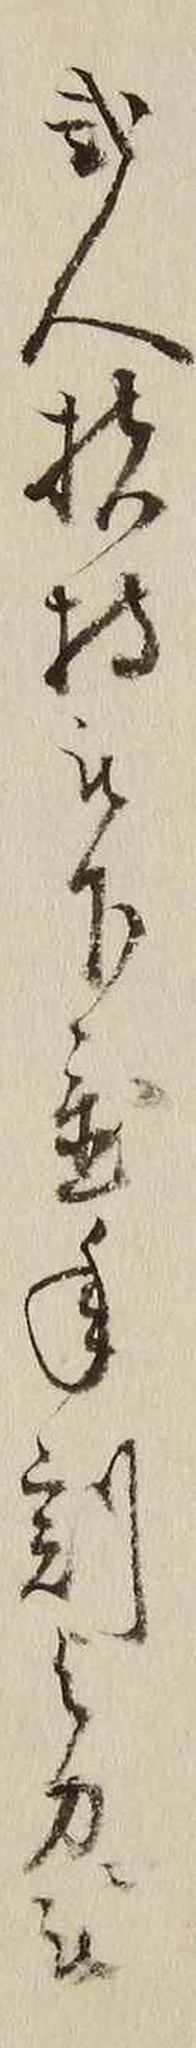弐人扶持被下置年割与力ニ被
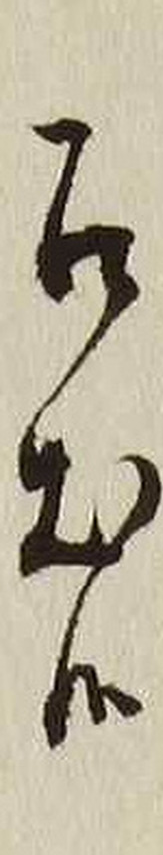召出候
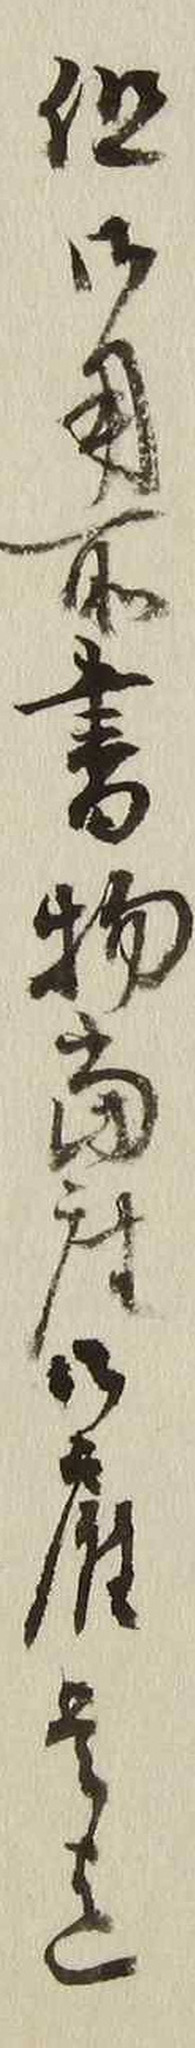但御用所書物当座御雇是迄
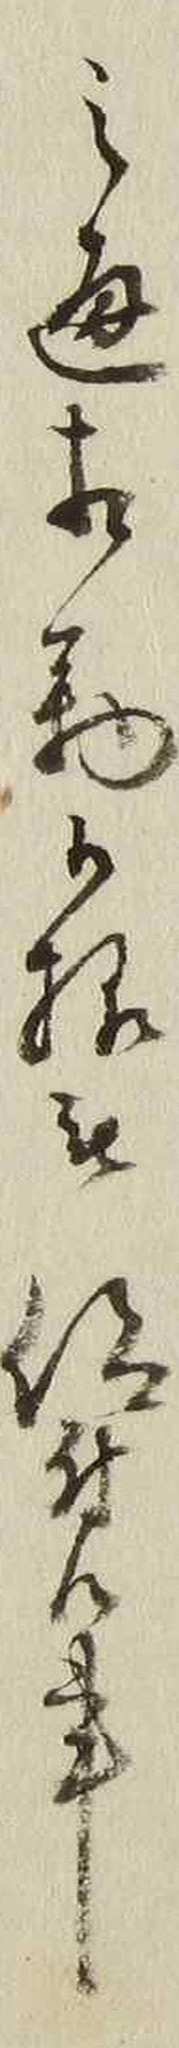之通相勤候様被仰付候事
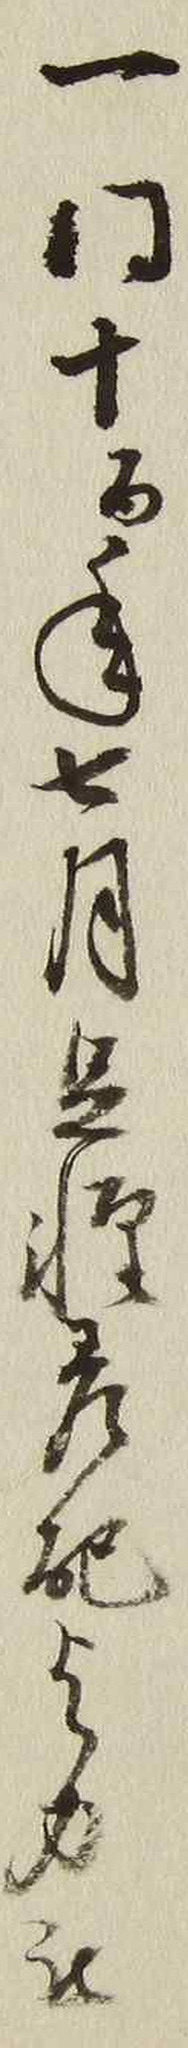一同十酉年七月足軽差配与力被
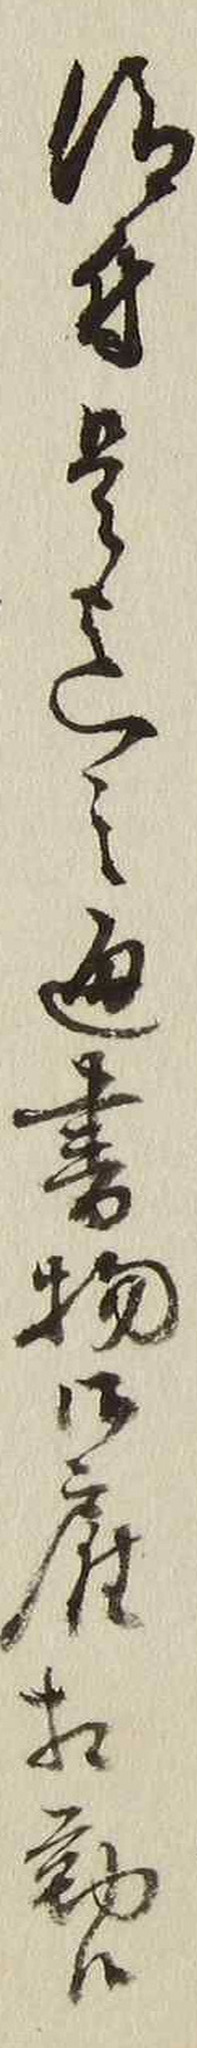仰付是迄之通書物御雇相勤候
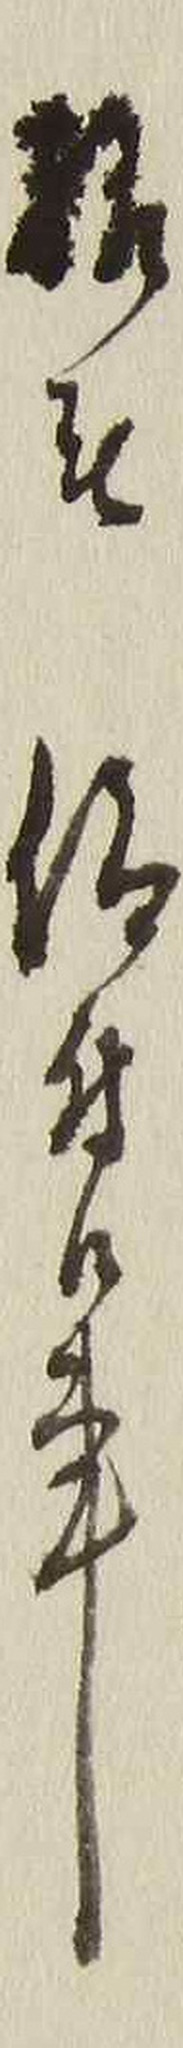様被仰付候事
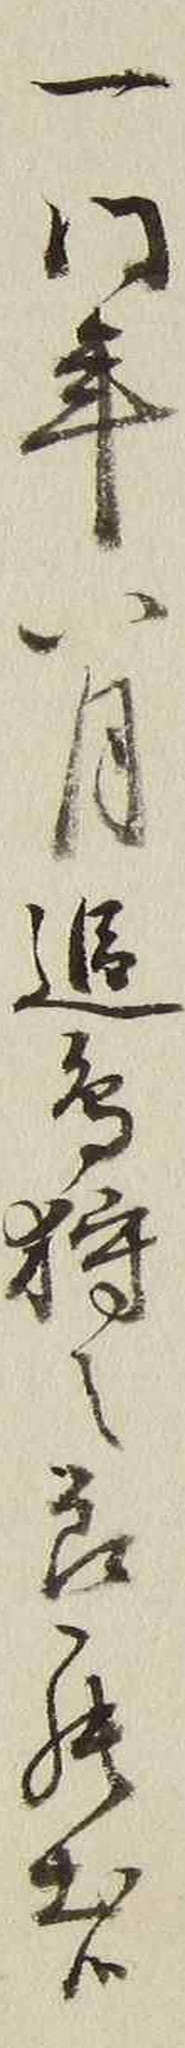一同年八月追鳥狩之節罷出候
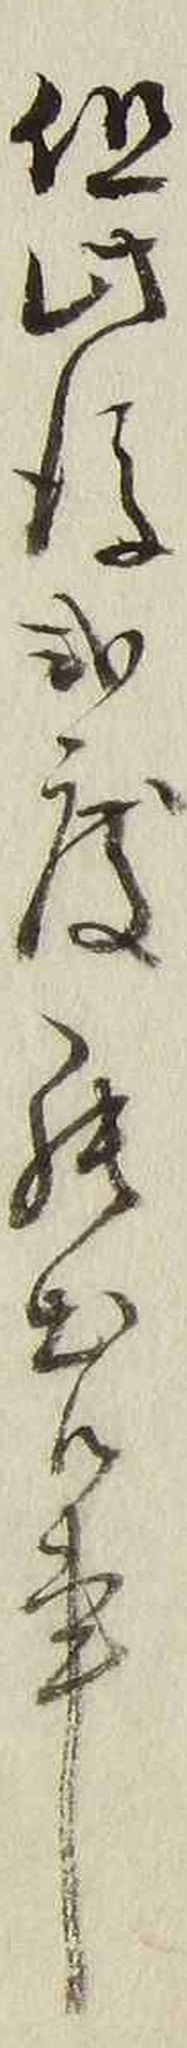但此後弐度罷出候事
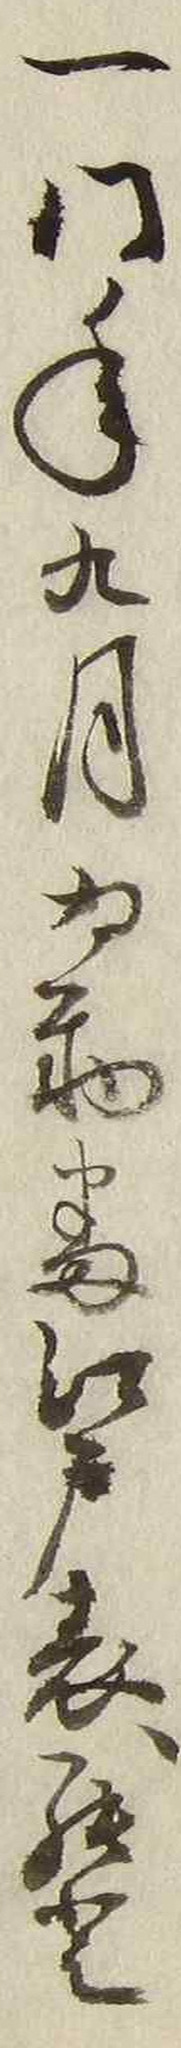一同年九月為勤番江戸表へ罷登

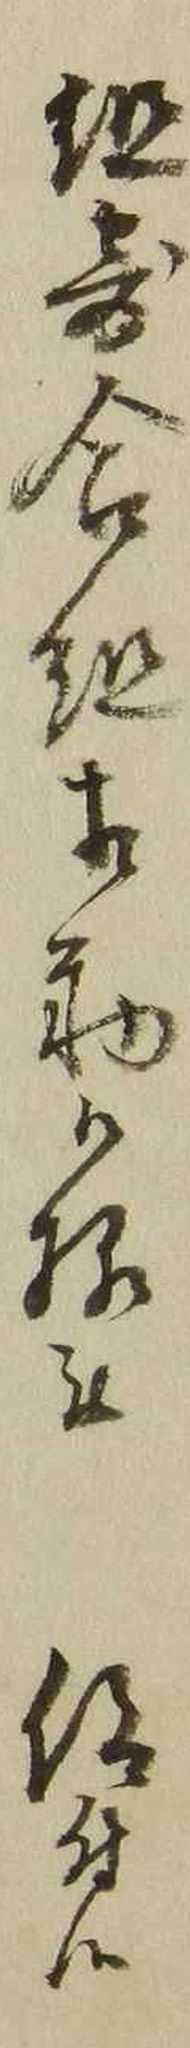組寄合組相勤候様被仰付候
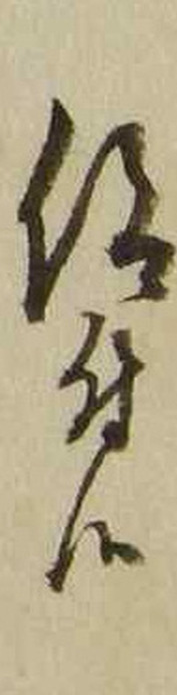仰付事
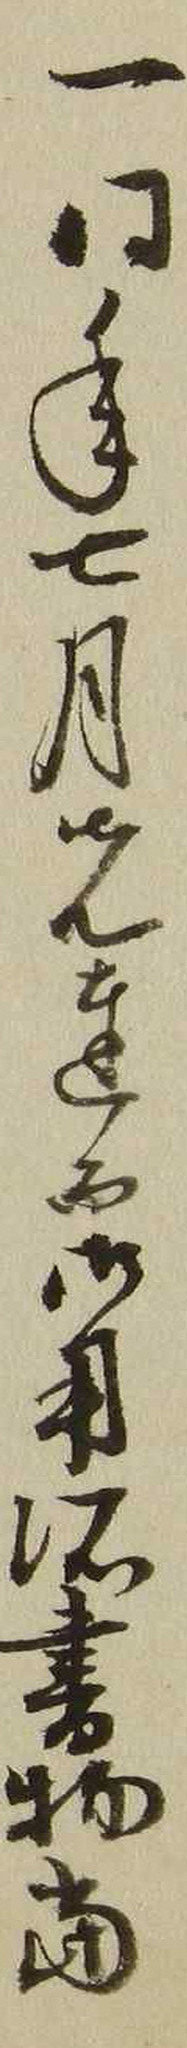一同年七月先達而御用所書物当
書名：諸士系譜　巻之39　は之部7
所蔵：会津若松市立会津図書館
